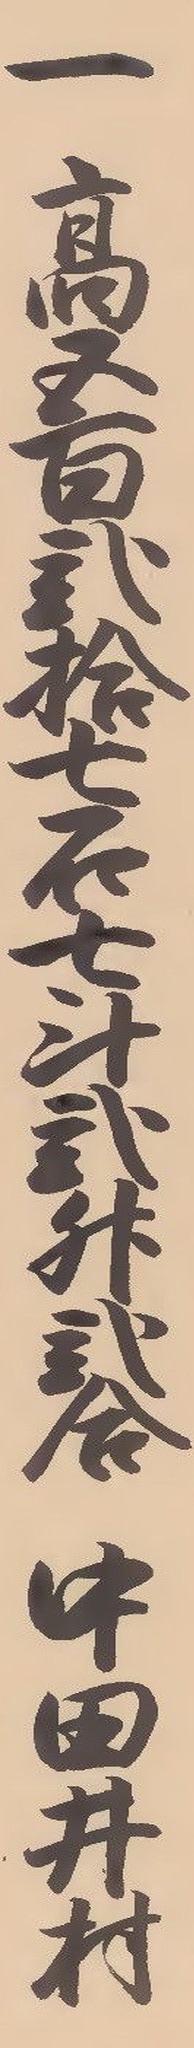一高五百弐拾七石七斗弐升弐合中田井村
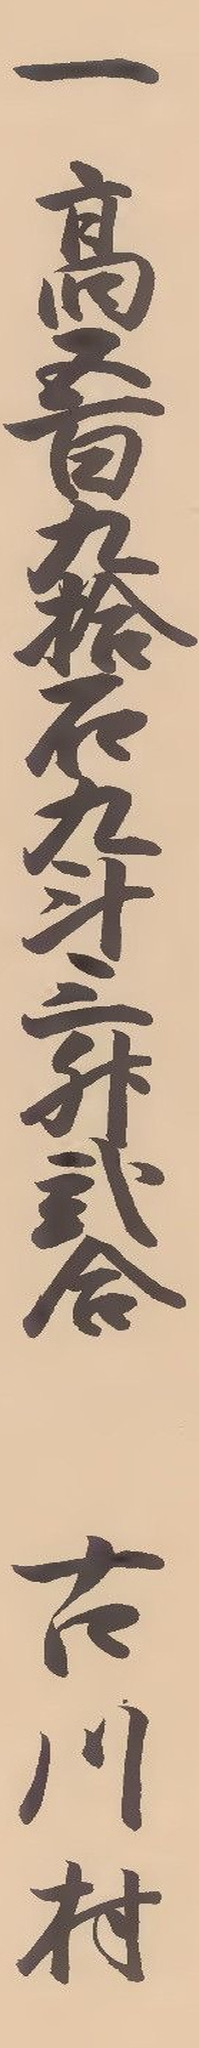一高五百九拾石九斗三升弐合古川村
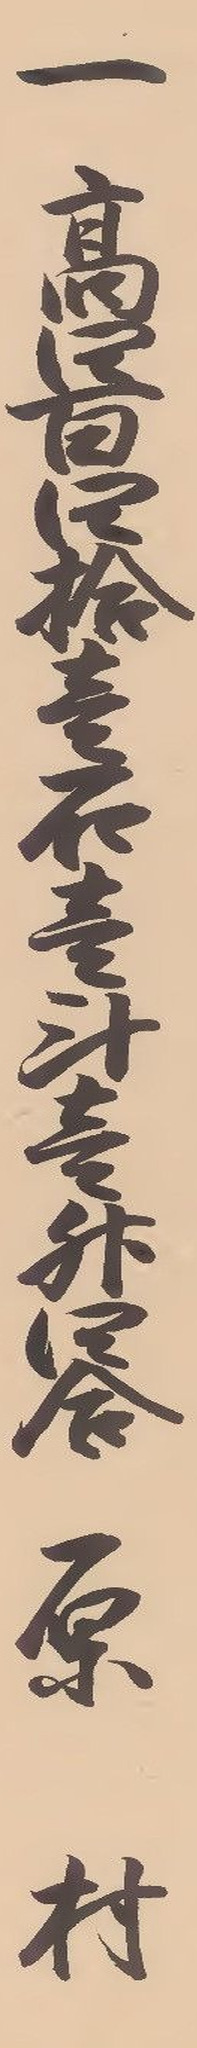一高四百四拾壱石壱斗壱升四合原村
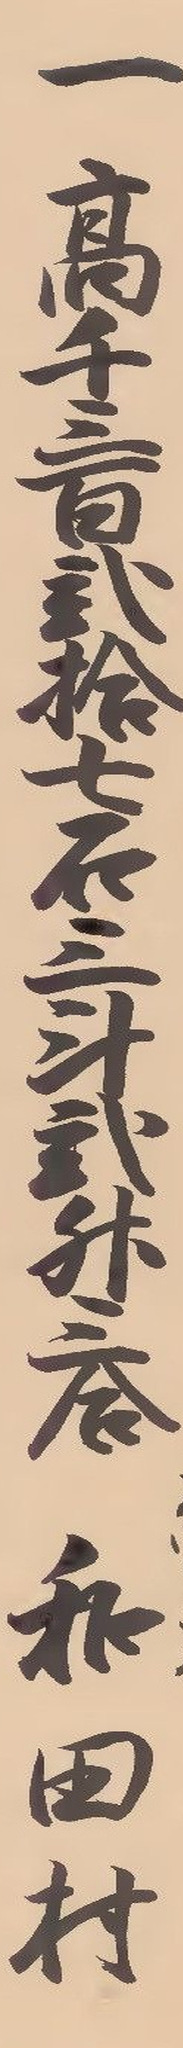一高五百弐拾七石七斗弐升弐合中田井村
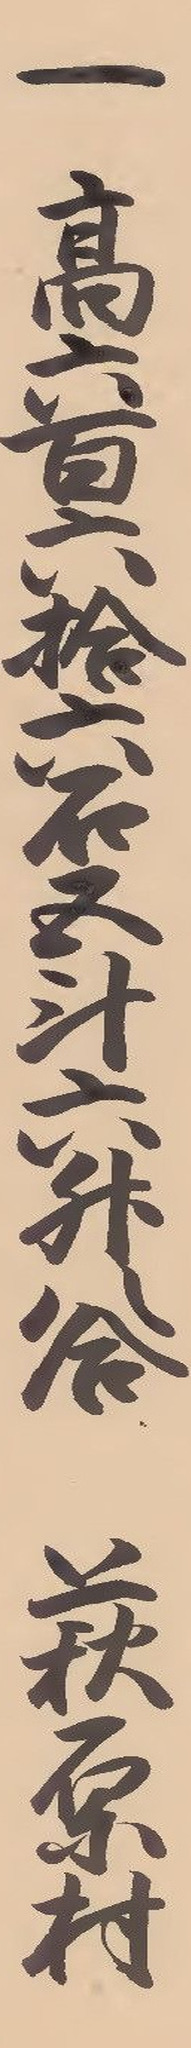一高六百六拾六石五斗六升八合萩原村
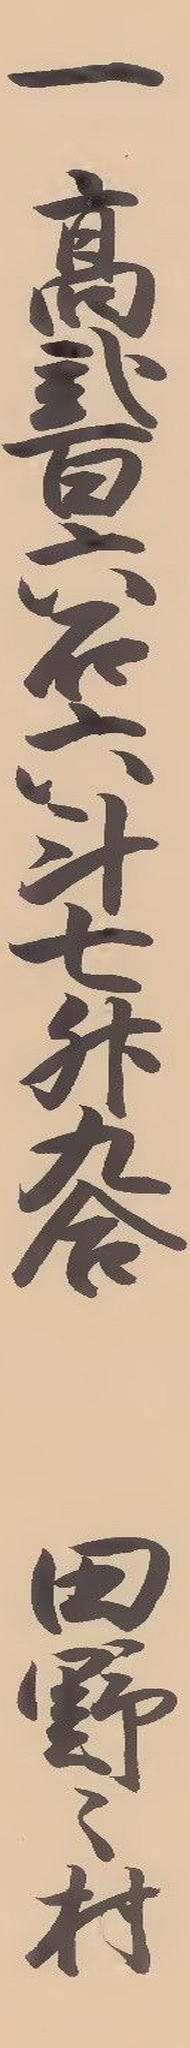一高弐百六石六斗七升九合田野々村
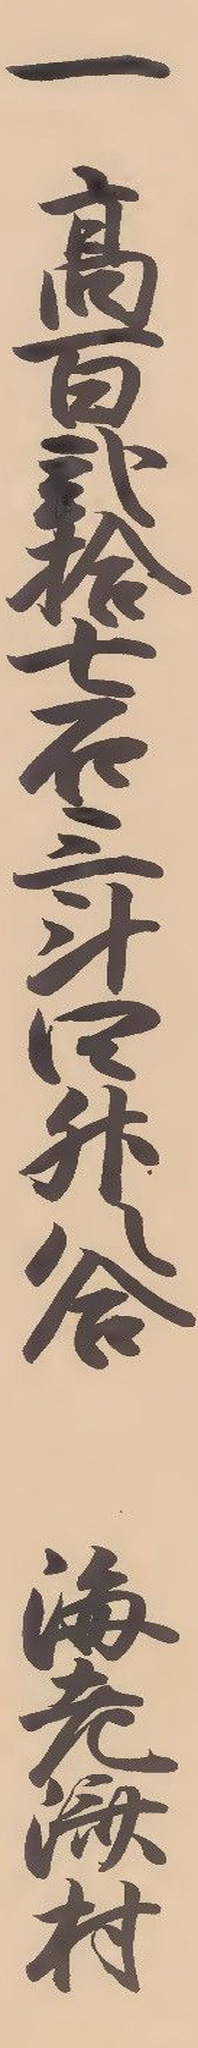一高百弐拾七石三斗四升八合海老済村
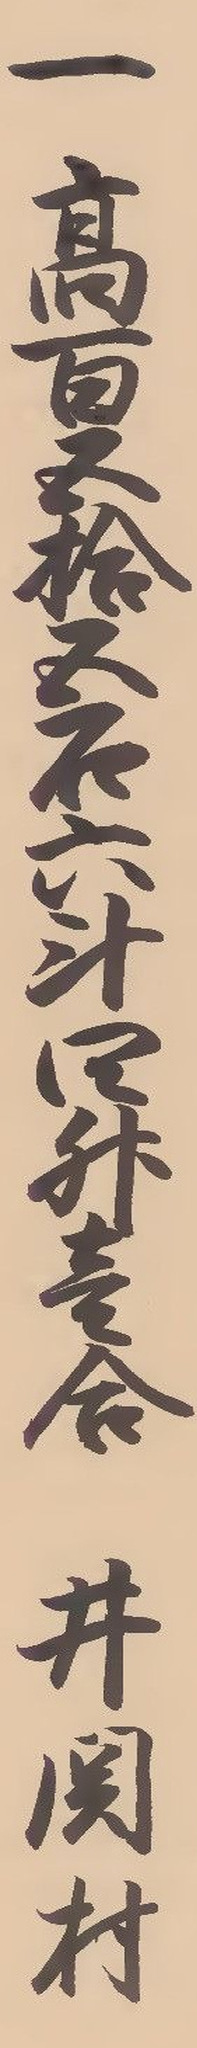一高百五拾五石六斗四升壱合井関村

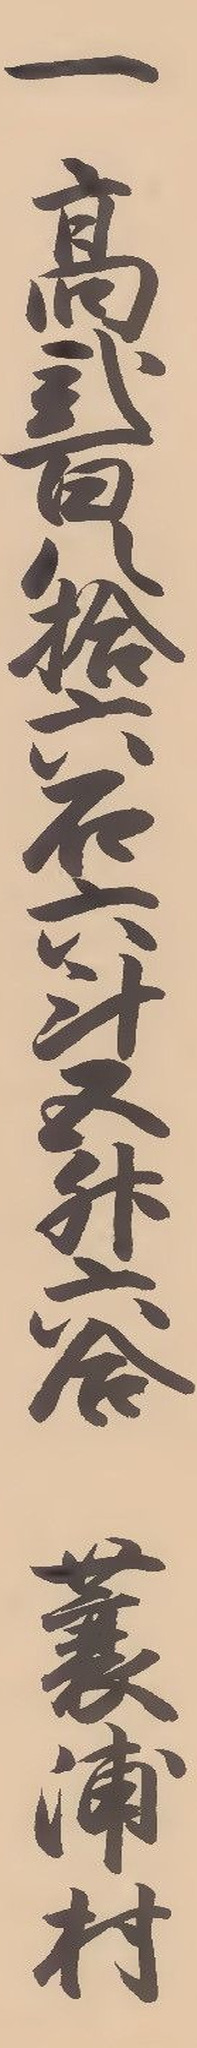一高弐百八拾六石六斗五升六合簔浦村
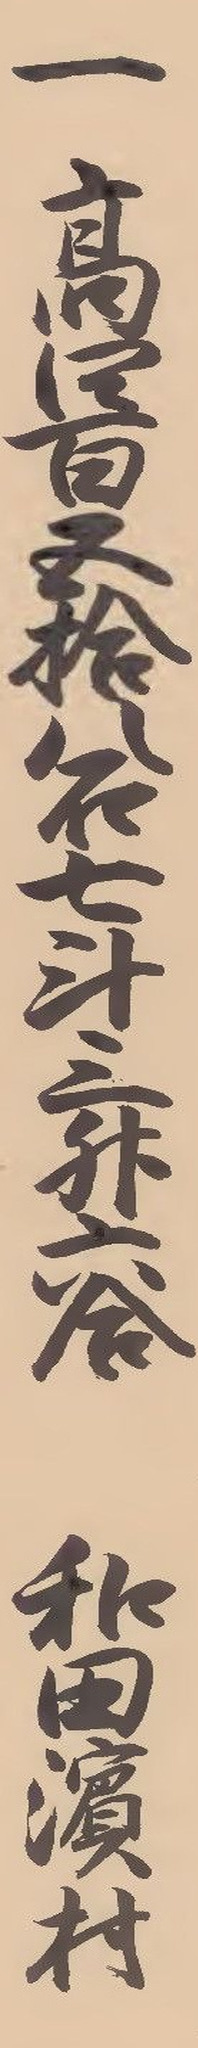一高四百五拾八石七斗三升六合和田浜村
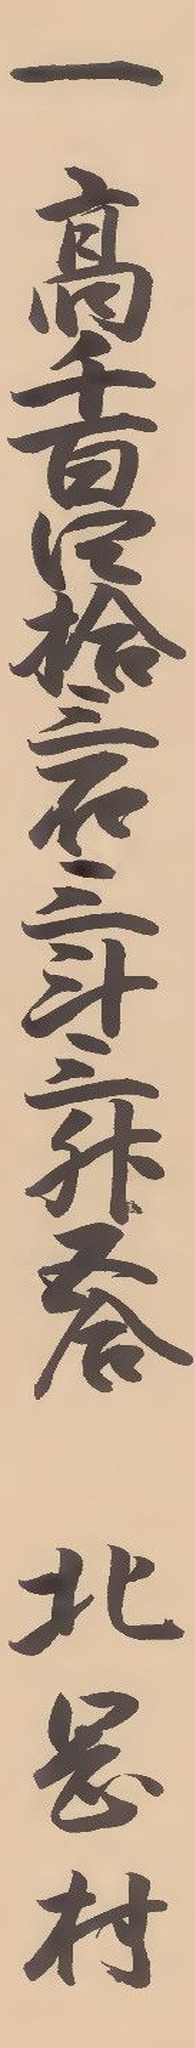一高千百四拾三石三斗三升五合北岡村
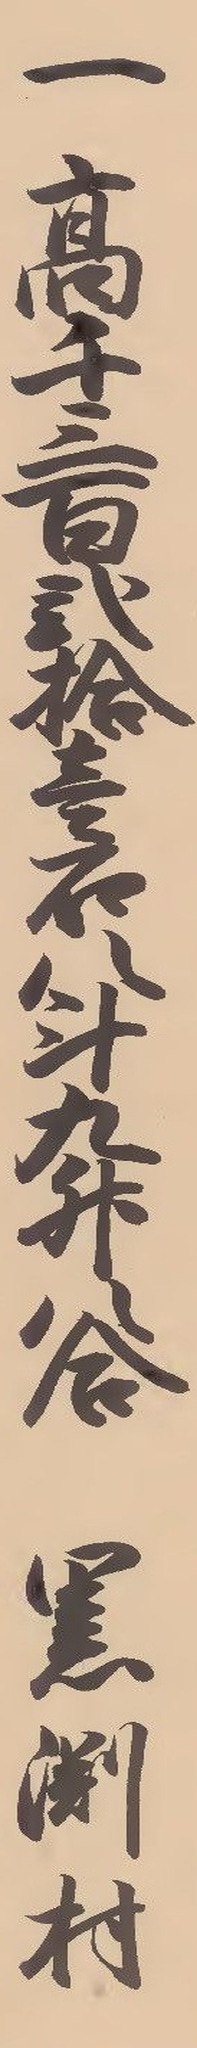一高千三百弐拾壱石八斗九升八合黒渕村
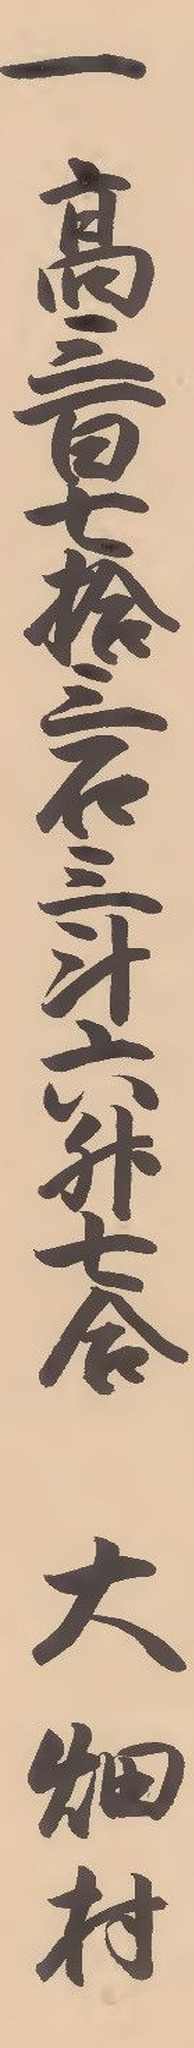一高三百七拾三石三斗六升七合大畑村
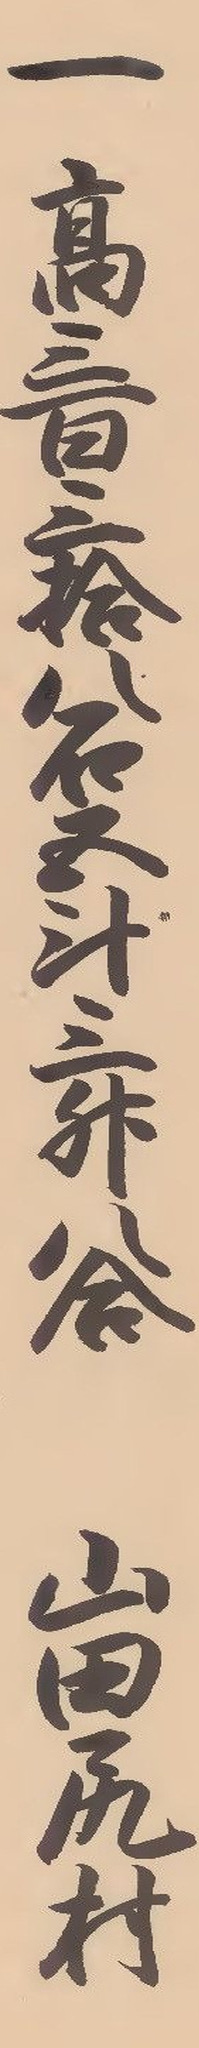一高三百三拾八石五斗三升八合山田尻村
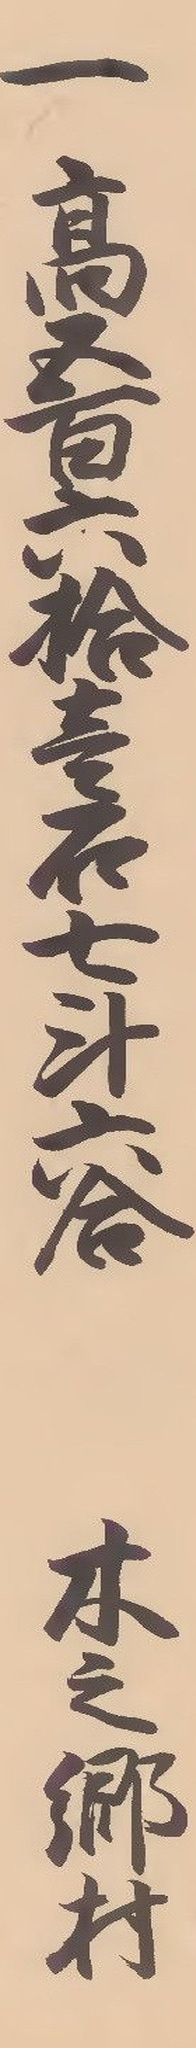一高五百六拾壱石七斗六合木之郷村

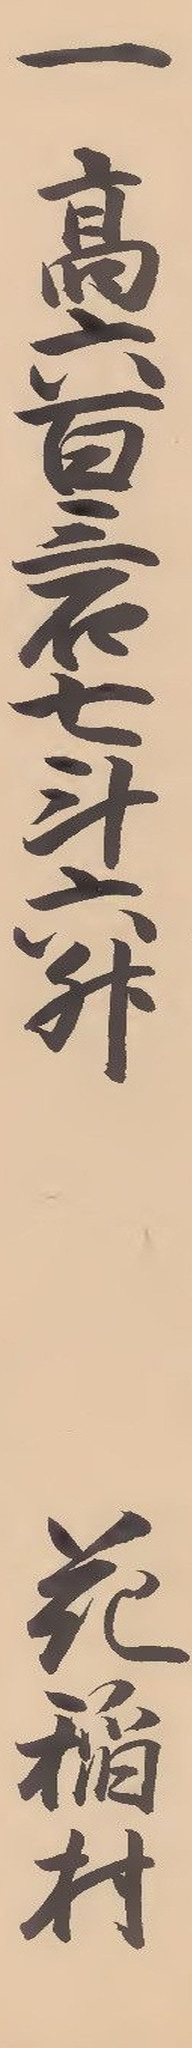一高六百三石七斗六升花稲村
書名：讃岐国郷帳
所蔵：国立公文書館 National Archives of Japan
